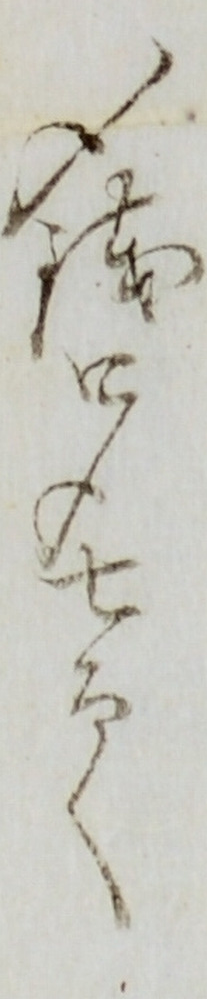〆銭四貫七百文

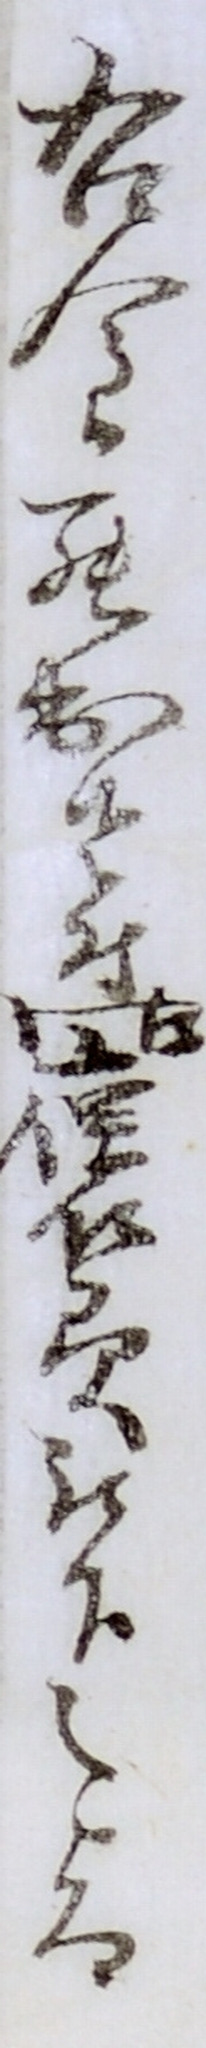右今日罷出候に付御褒美被下之旨
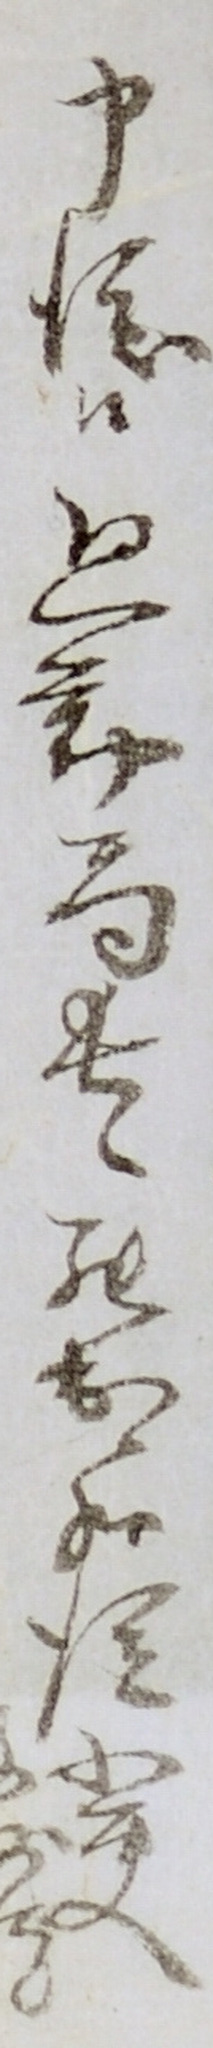申渡候廻勤局長へ罷出候処従小吏
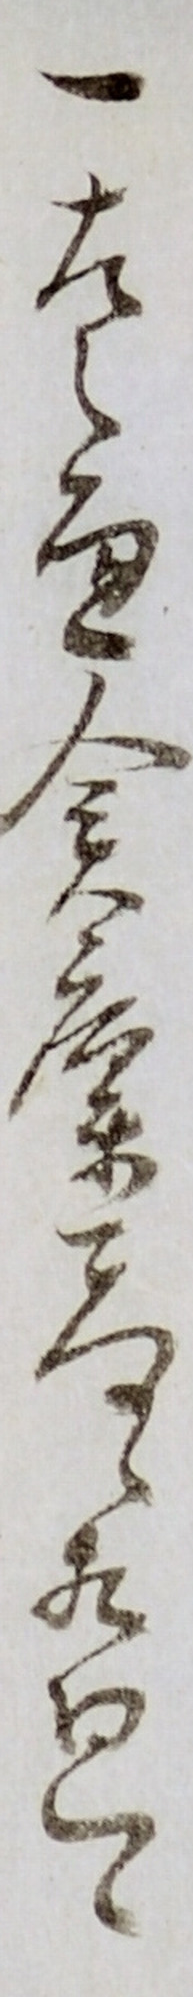一左之通倉廩局へ相廻候
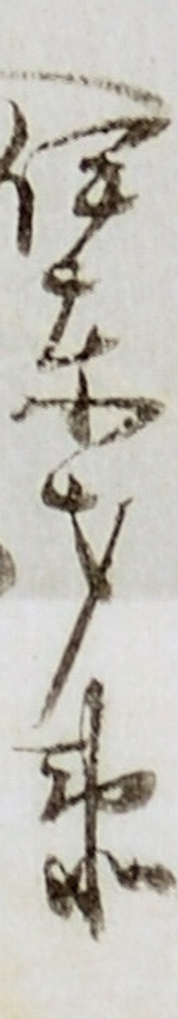伊東礒衛
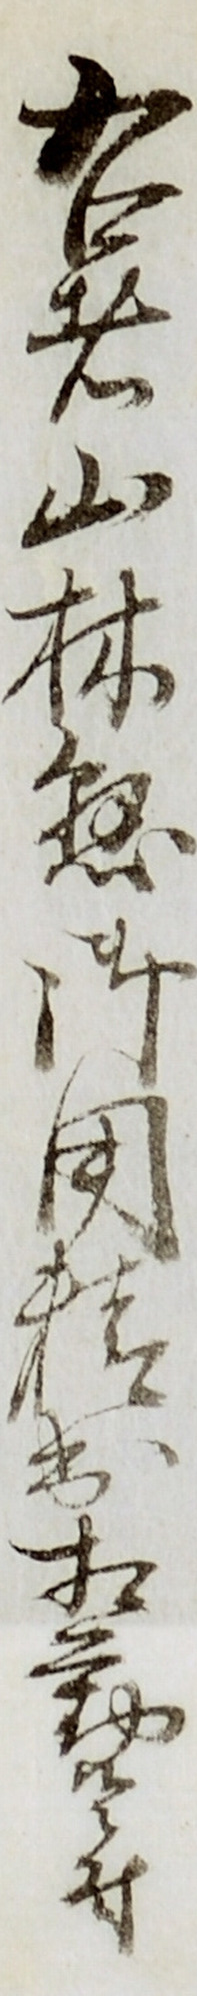右は山林懸御用精出相勤候に付
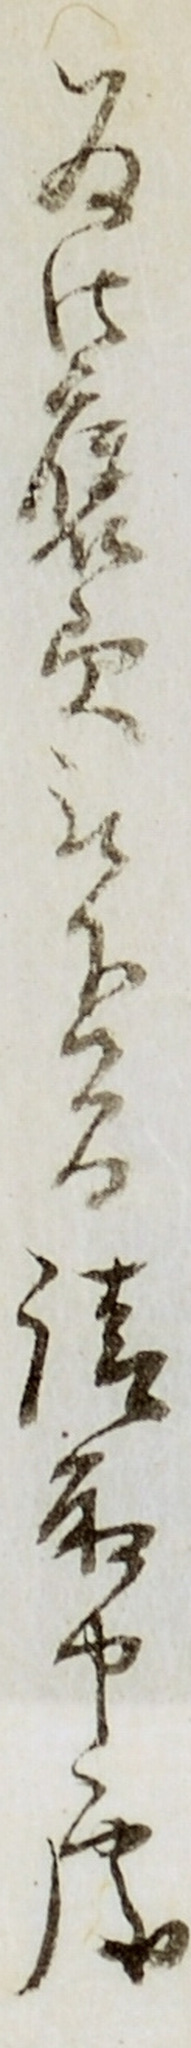為御褒美被下候間請取申処
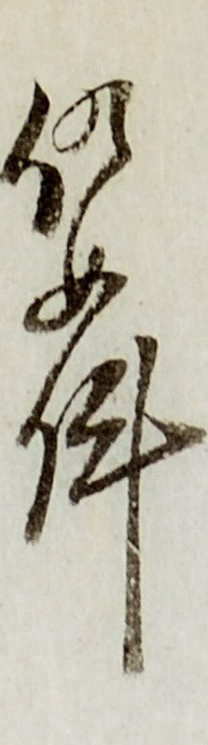仍如件
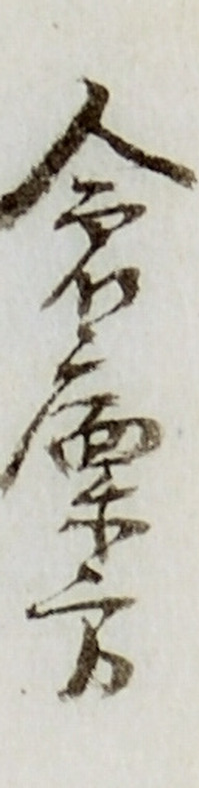倉廩方
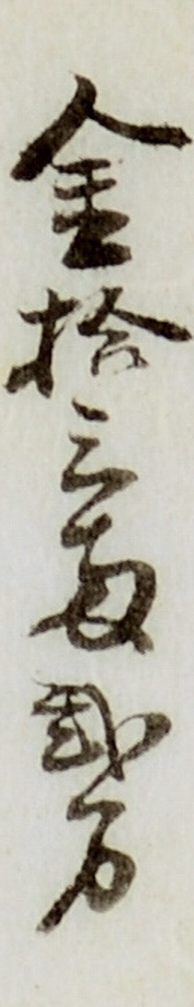金拾三両弐分
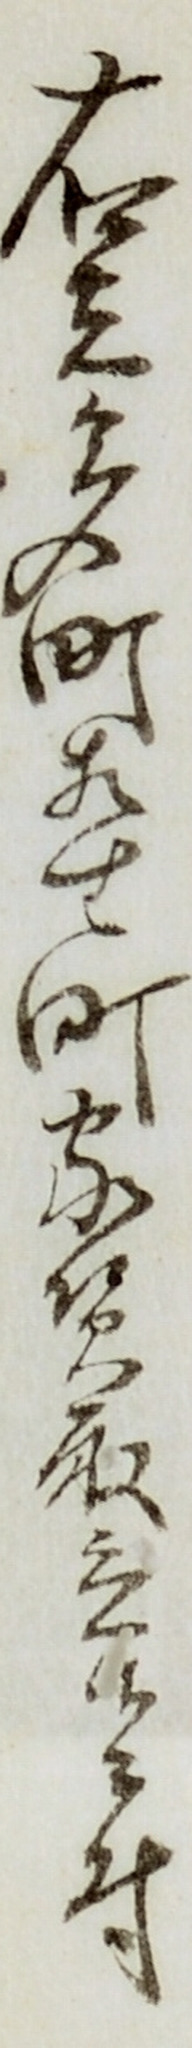右は多町相生町家賃取立候に付
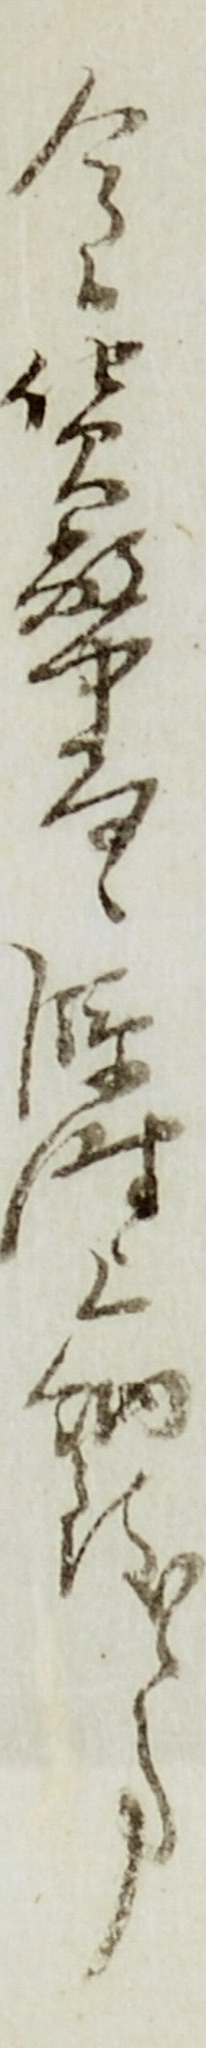今日貨幣局へ臨時上納致候事
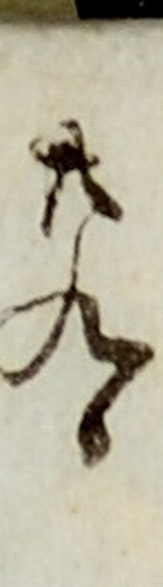廿九日
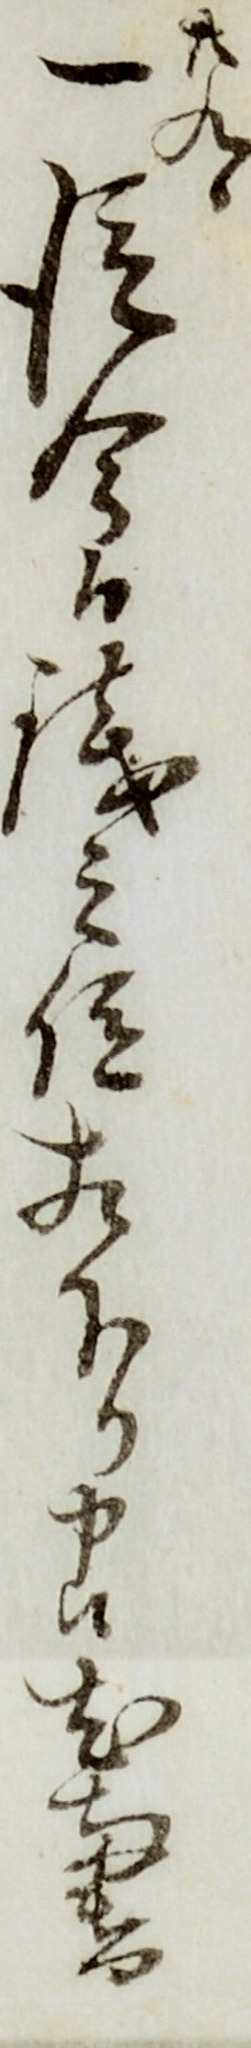一従今日銭之位相下り申候尤両替
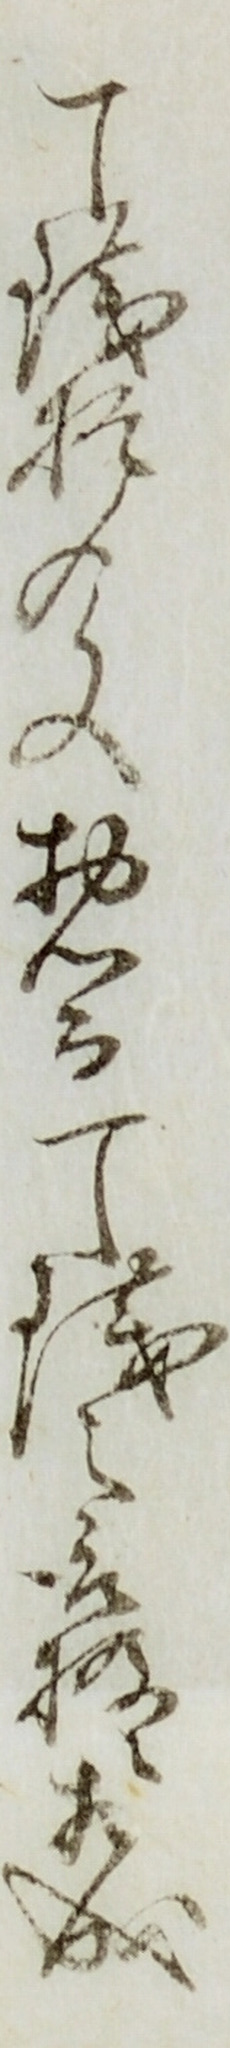丁銭拾貫文惣て丁銭之取扱に相成

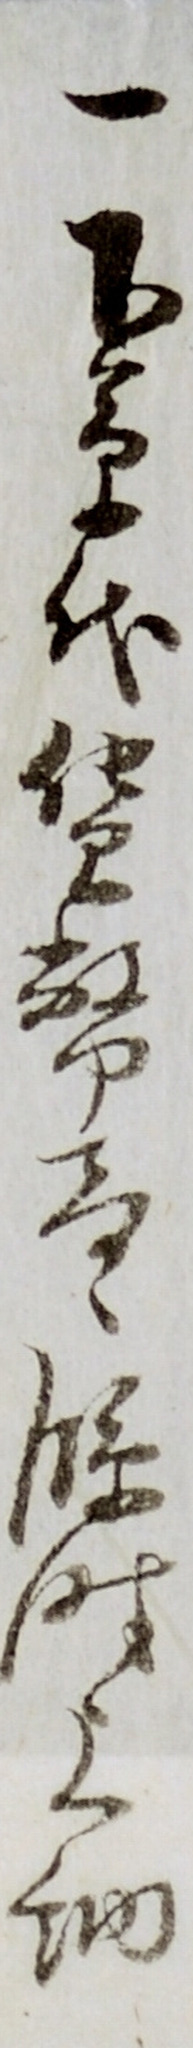一下草代貨幣局へ臨時上納
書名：山林方諸事御用留
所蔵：伊那市立高遠町図書館・合同会社AMANE
